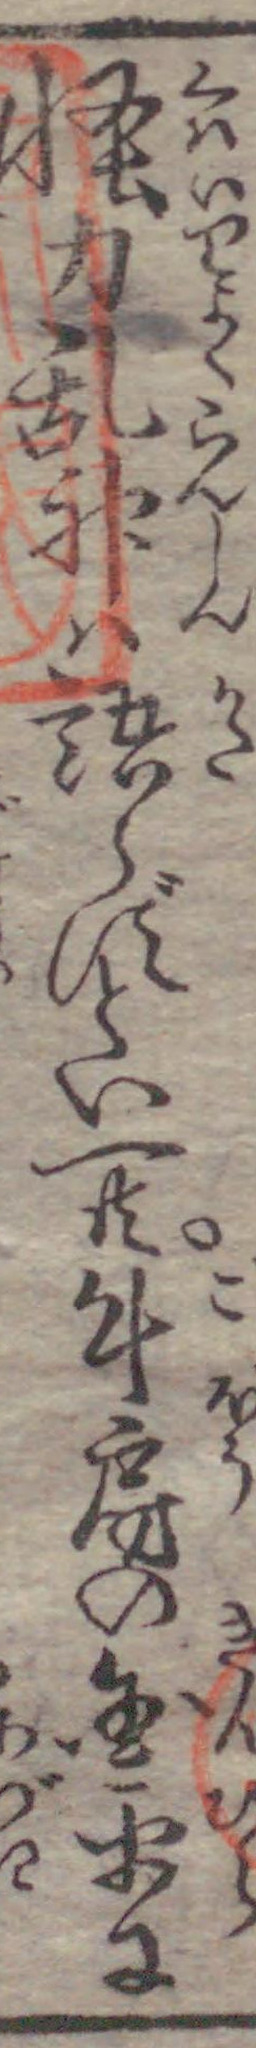怪力乱神はかたらずといへ共。牛房の金平に
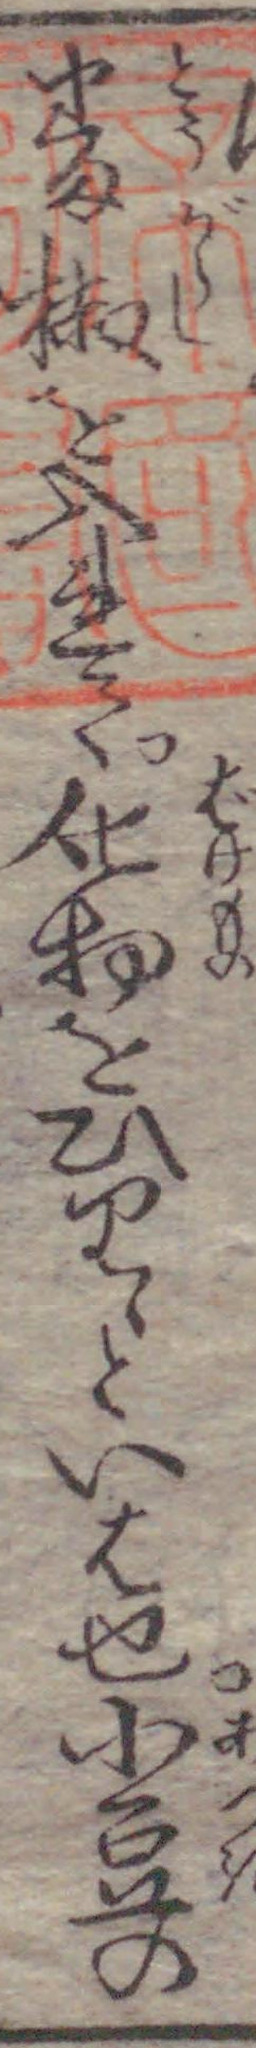番椒を入れて。化物をひりゝといはせ。小豆の
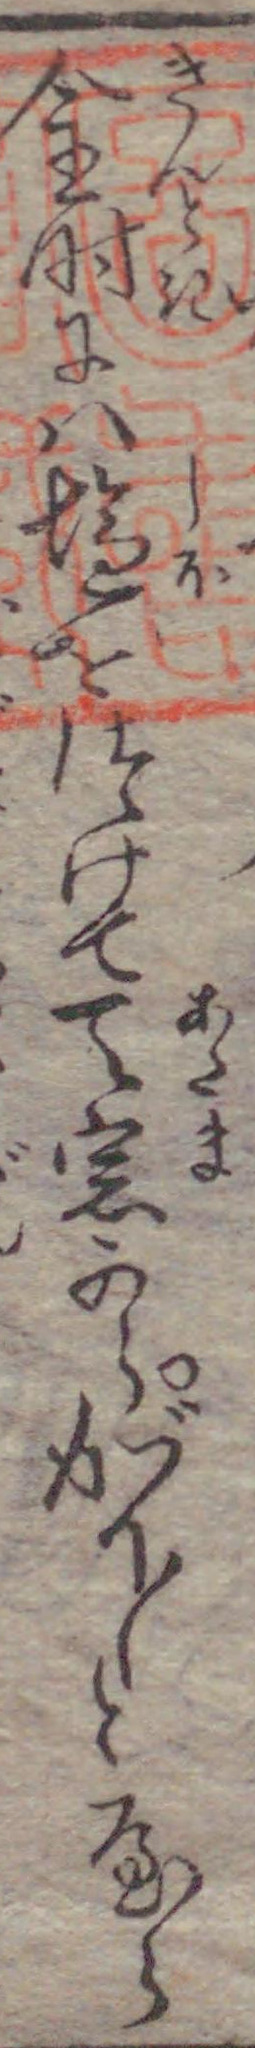金時には塩をつけて天窓から。がり〳〵とやら
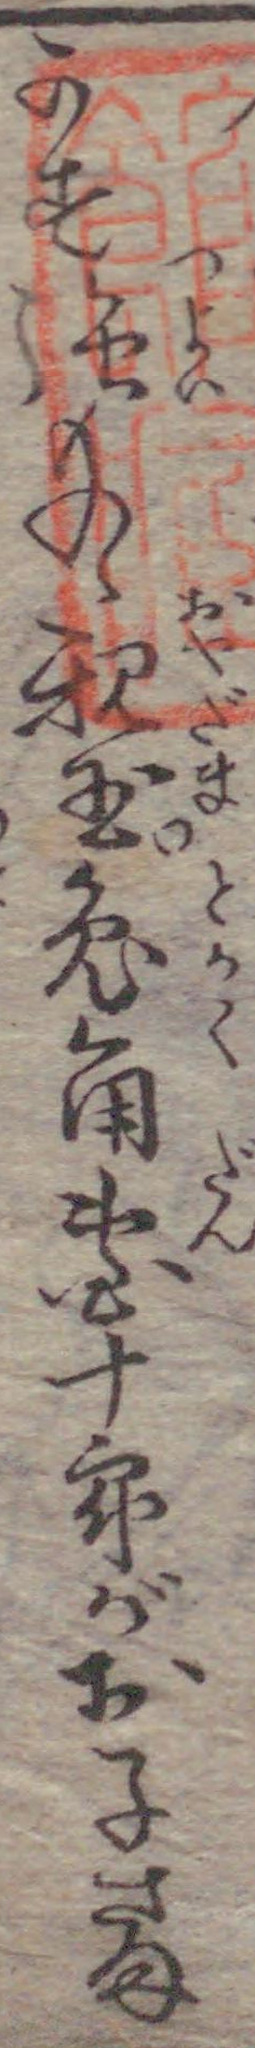かす強ものゝ親玉。兎角團十郎がお子さま
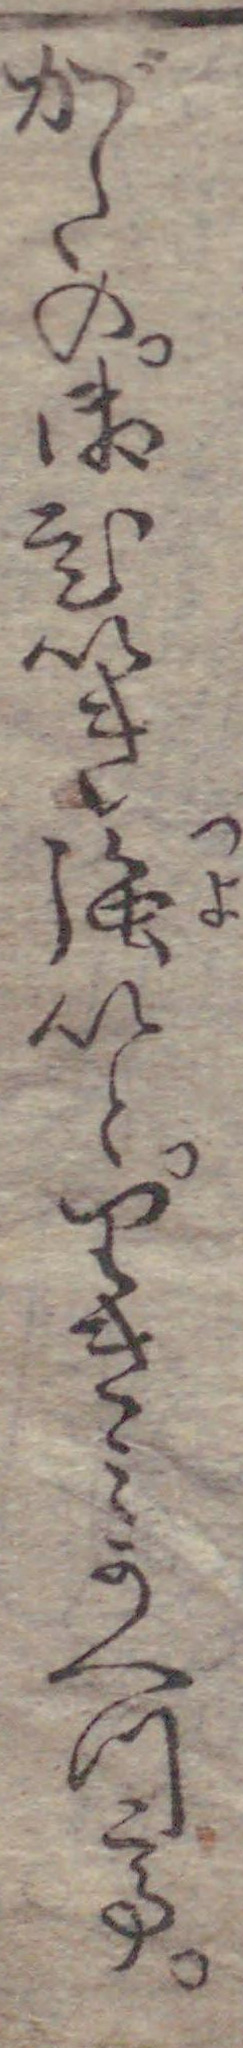がたの。御ひいき強いと。りきみかへつ高。
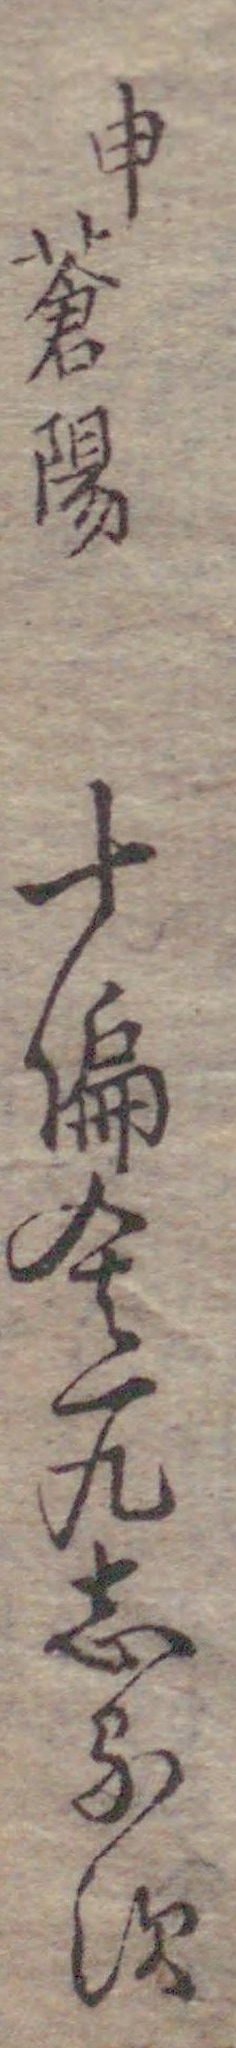蒼陽十編舎一九しるす

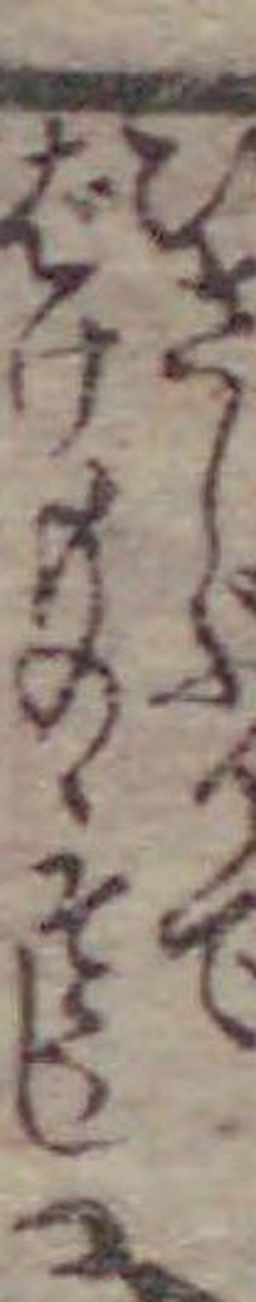ばけものゝそうし
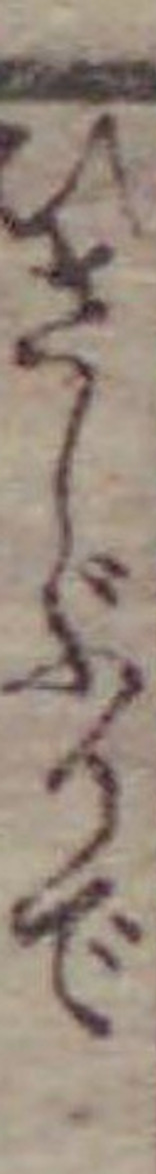ひさしぶりで
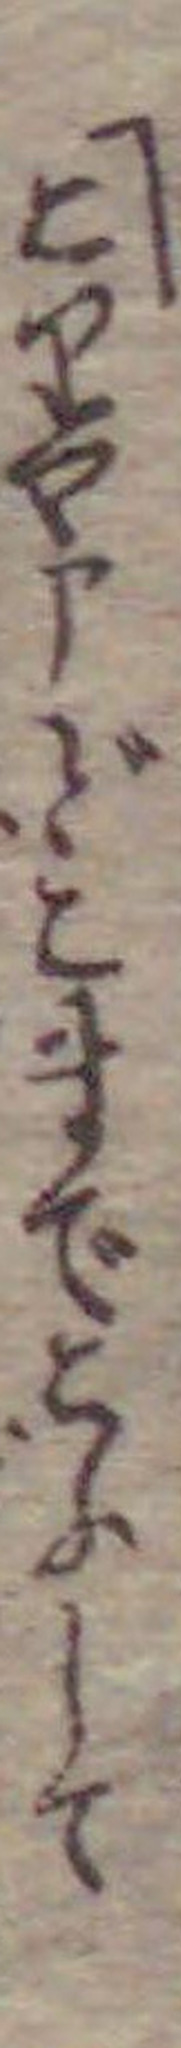〽こりやァどこまでこふして
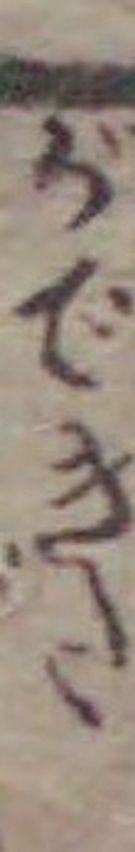ができた
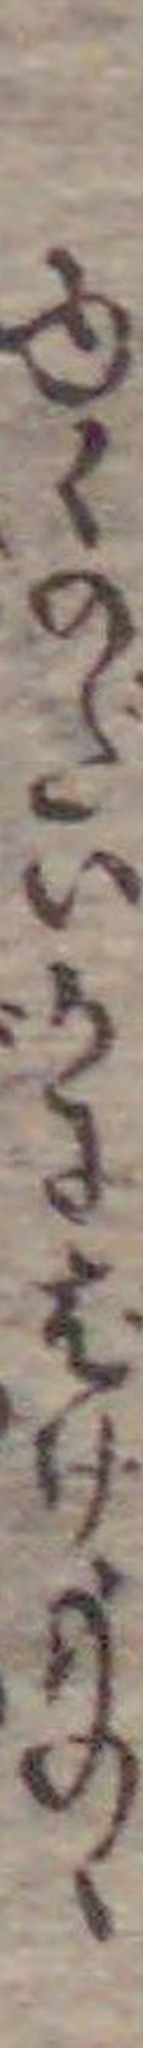ゆくのだいかにばけものゝ
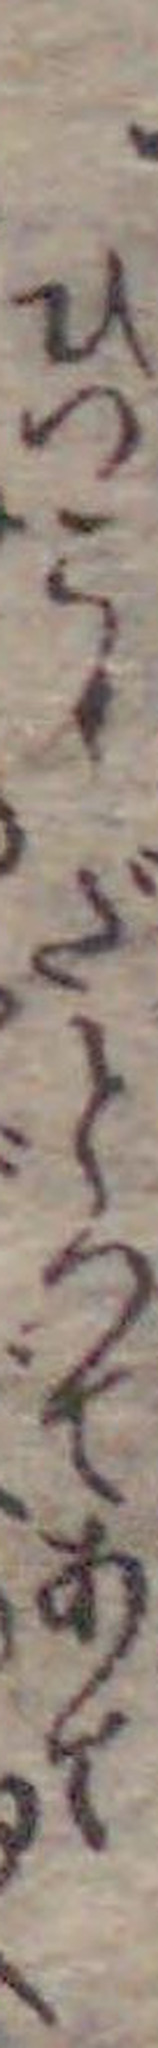ひつこしだといつてあて
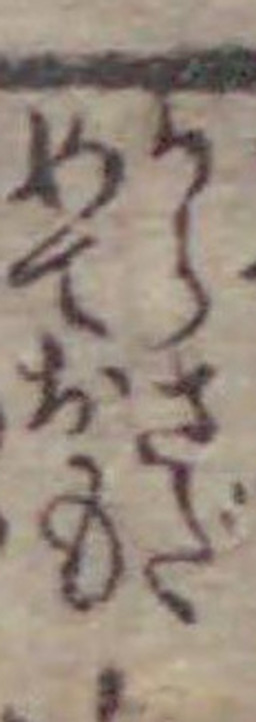めておも
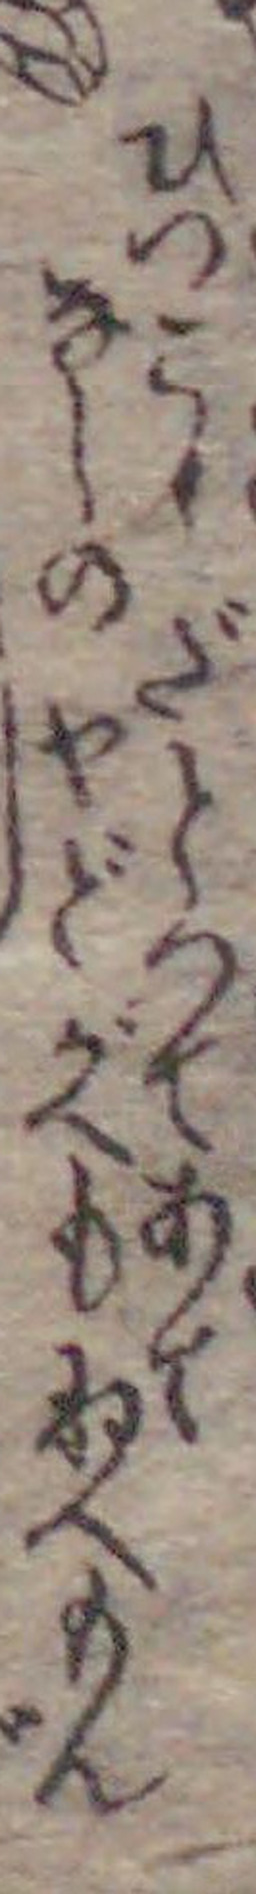なしのやどがへもねへもんだ
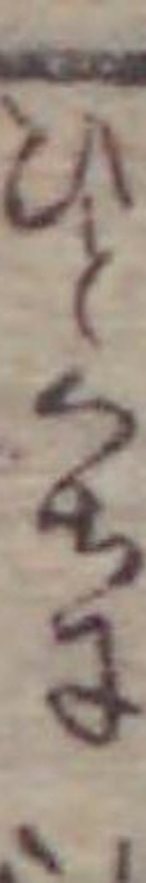ひとくちに
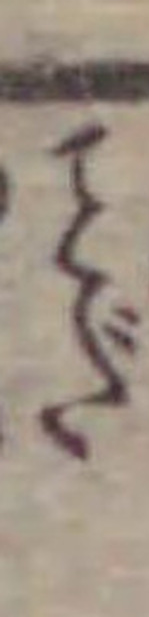ことだ
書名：化物見世開 : 2巻
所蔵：国立国会図書館 National Diet Library, JAPAN
